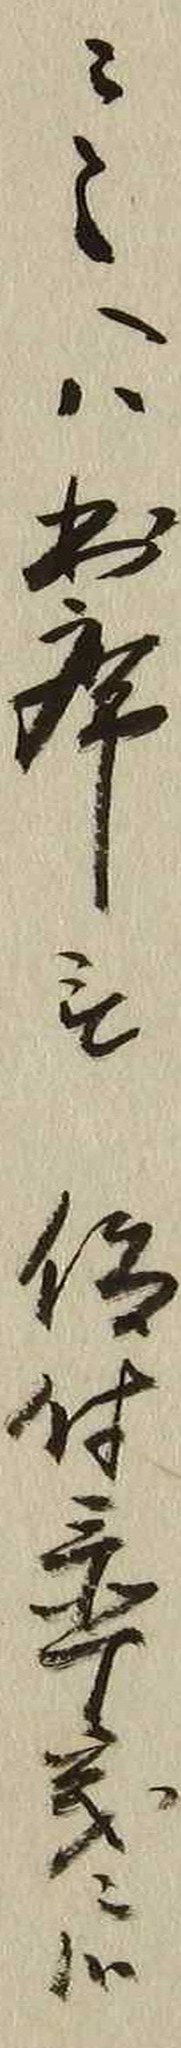々々へハ出席被仰付置義ニ候
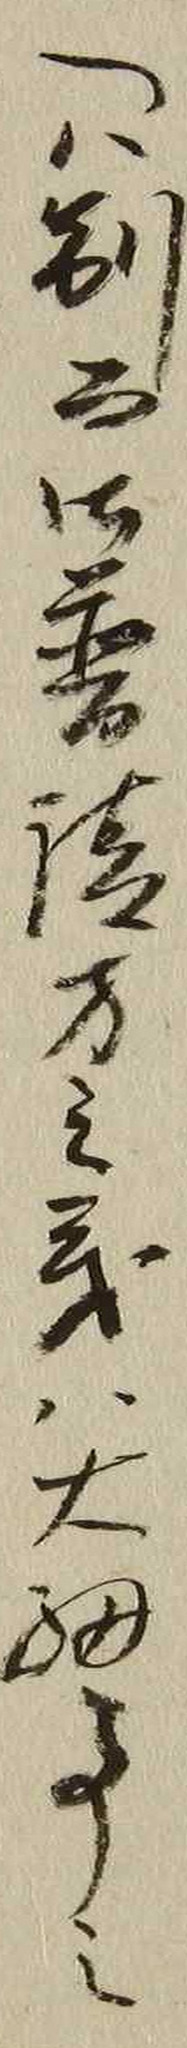へハ別而御普請方之義ハ大細事之
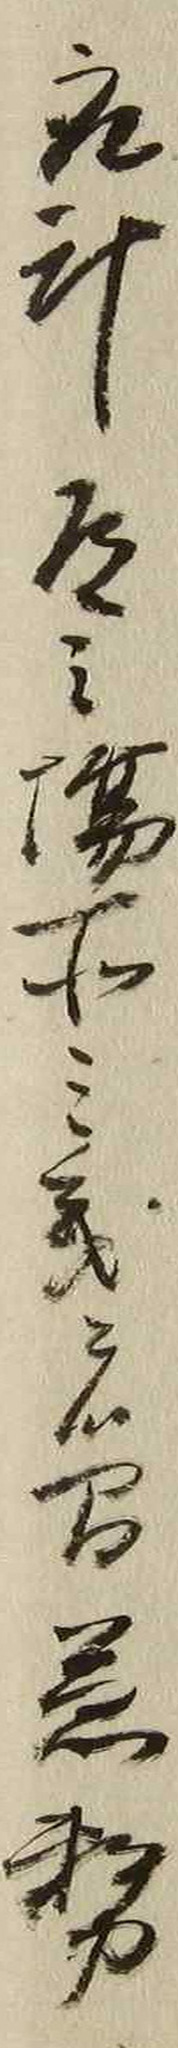取計有之場所之義ニ候間兼務
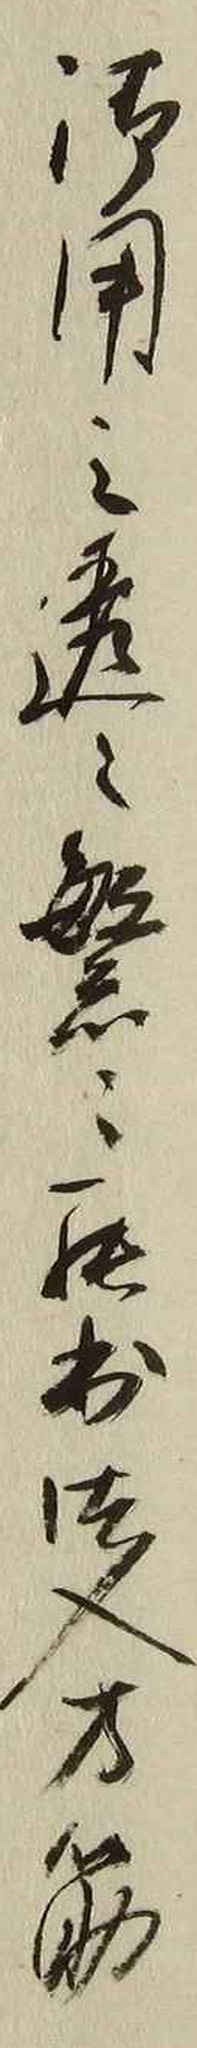御用之透々繁々罷出御入方筋
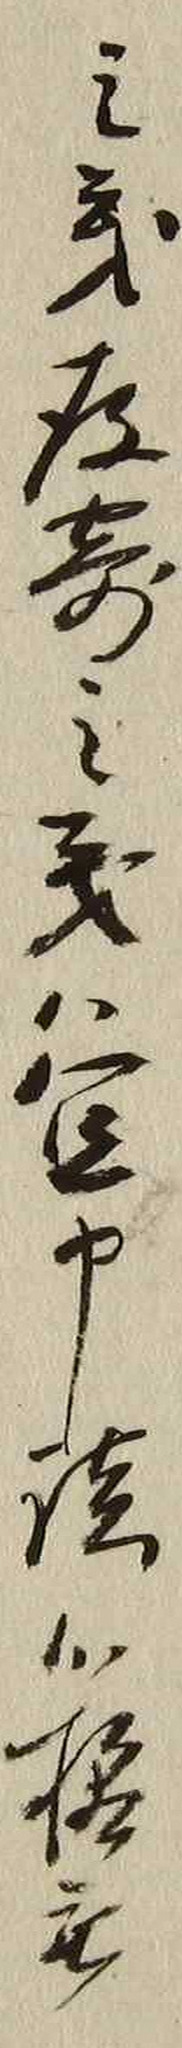之義存寄之義ハ宜申談候様被
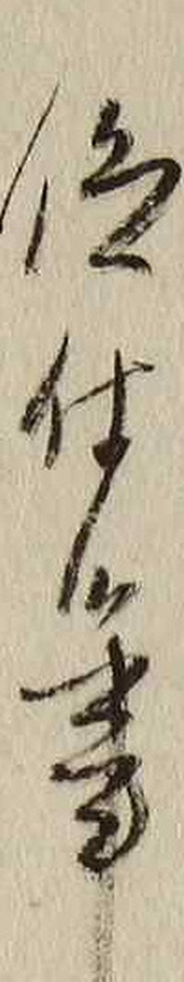仰付候事
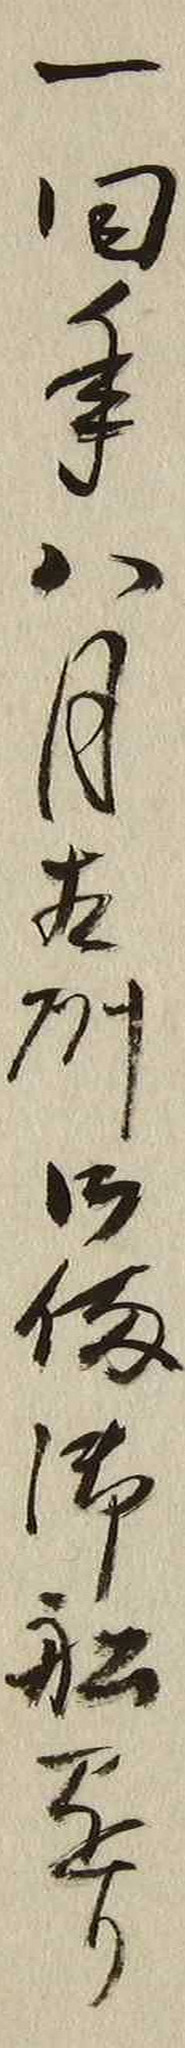一同年八月相州御備御船懸り
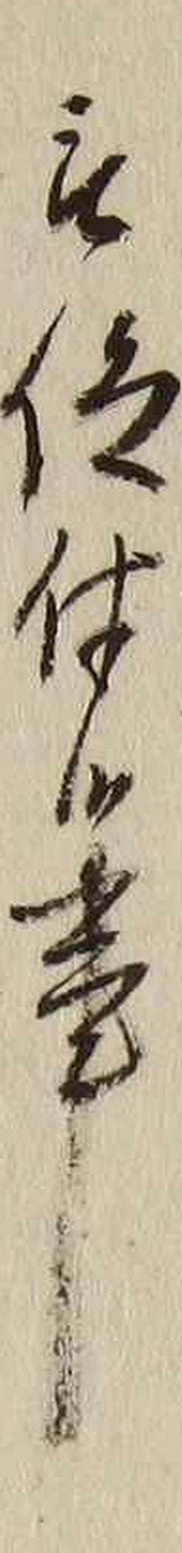被仰付候事
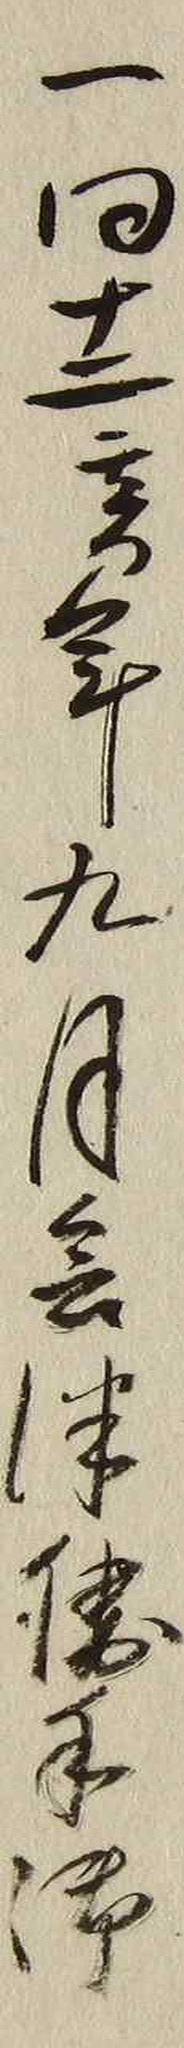一同十二亥年九月会津勝手御
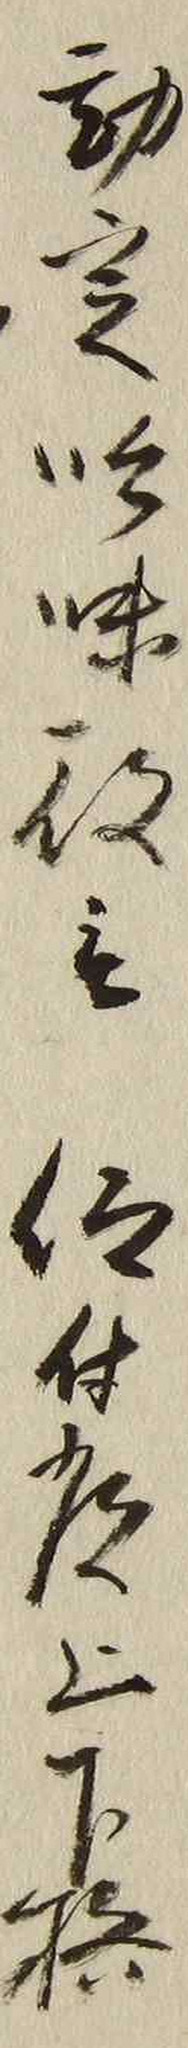勘定吟味役被仰付常上下格
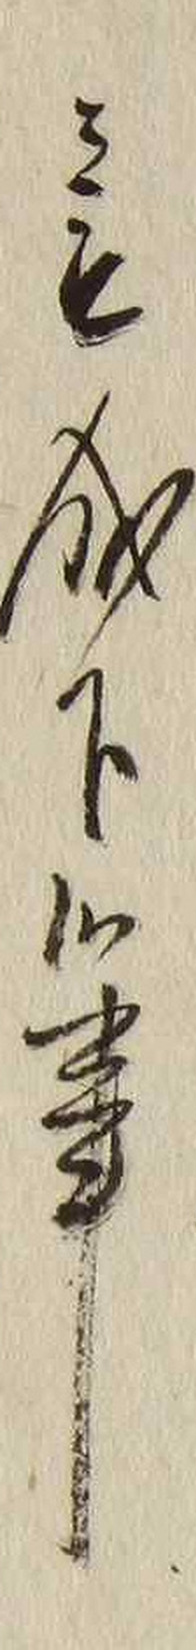被成下候事
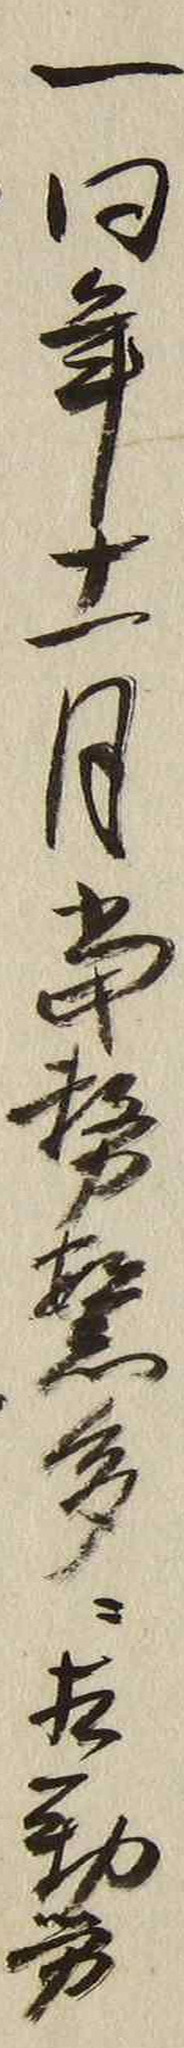一同年十一月当務繁多ニ相勤労
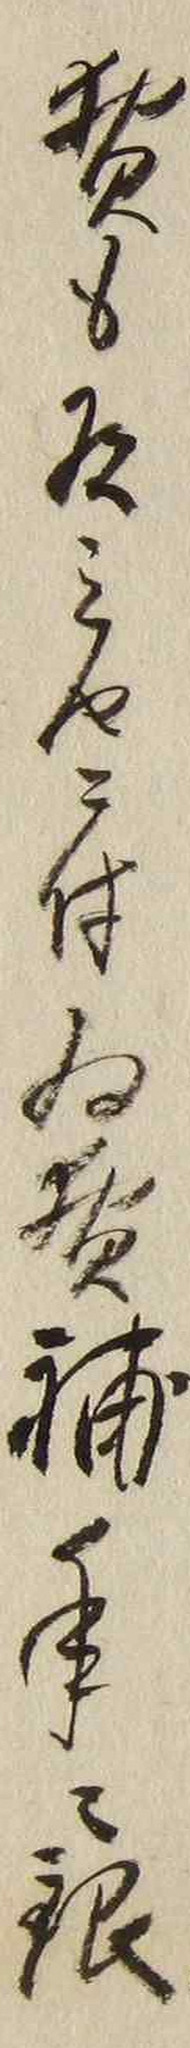費も有之由ニ付為費補年ニ銀

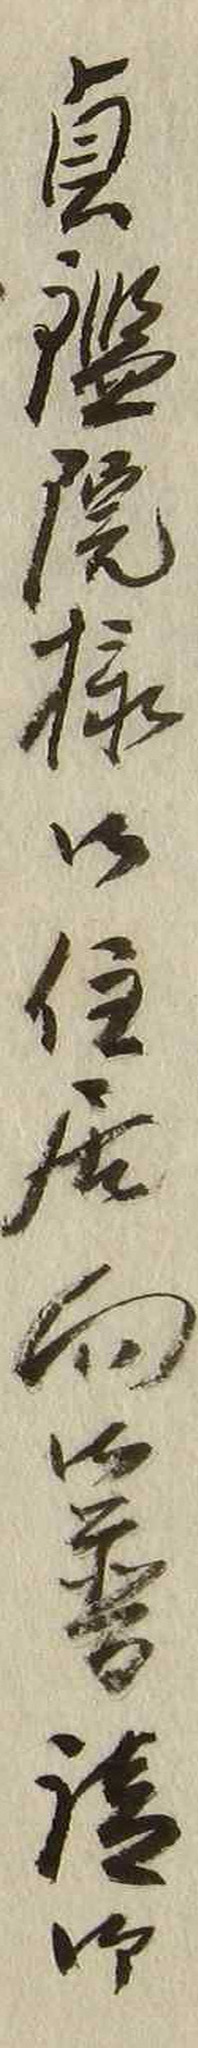貞鑑院様御住居向御普請御
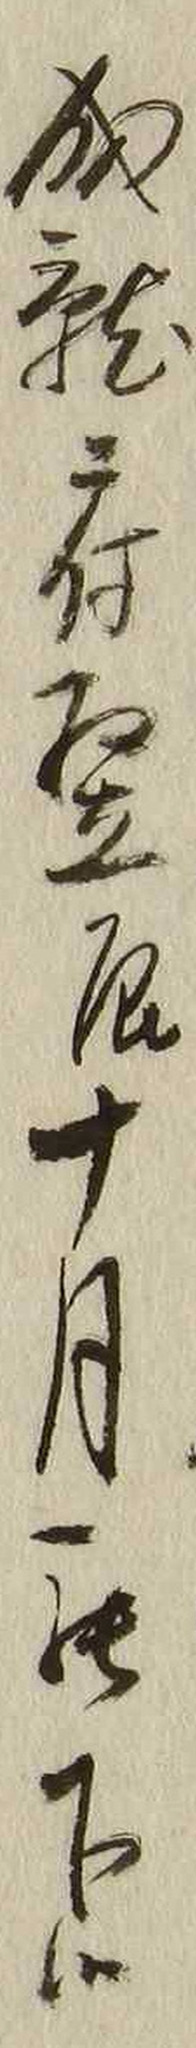成就ニ付翌辰十月罷下候
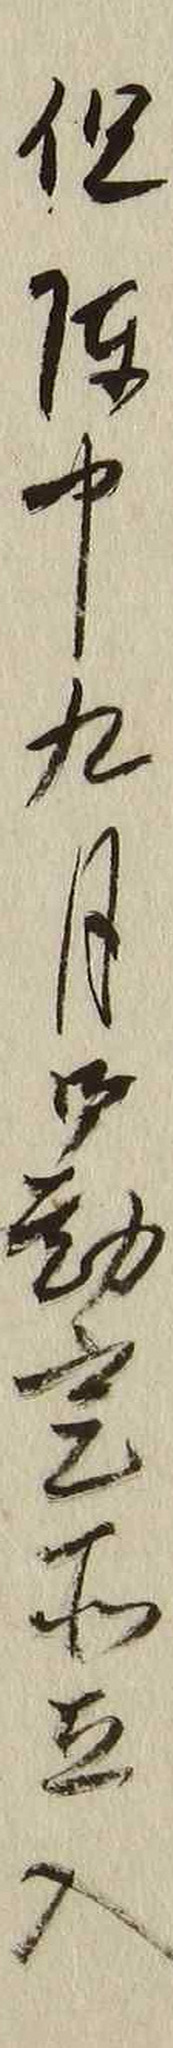但陣中九月御勘定所立入
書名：諸士系譜　巻之346　も之部2
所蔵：会津若松市立会津図書館
